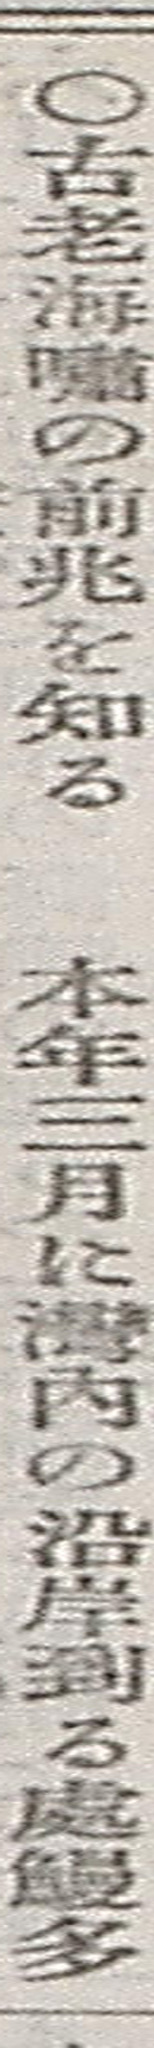○古老海嘯の前兆を知る本年三月に湾内の沿岸到る処鰻多
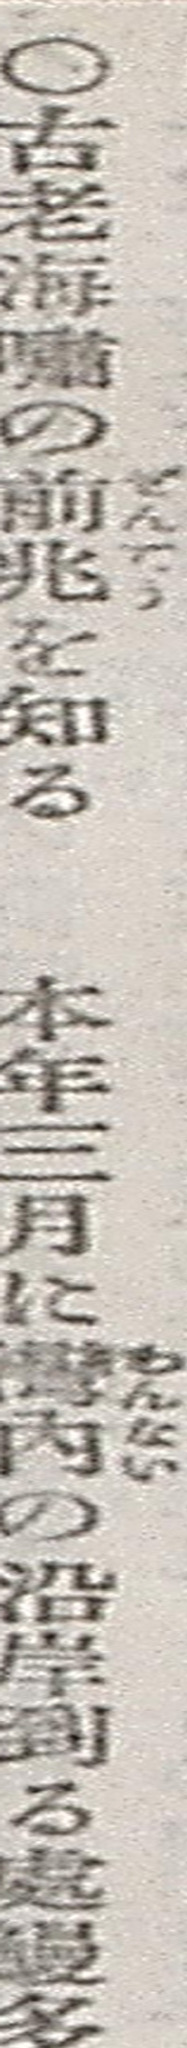○古老海嘯の前兆を知る本年三月に湾内の沿岸到る処鰻多
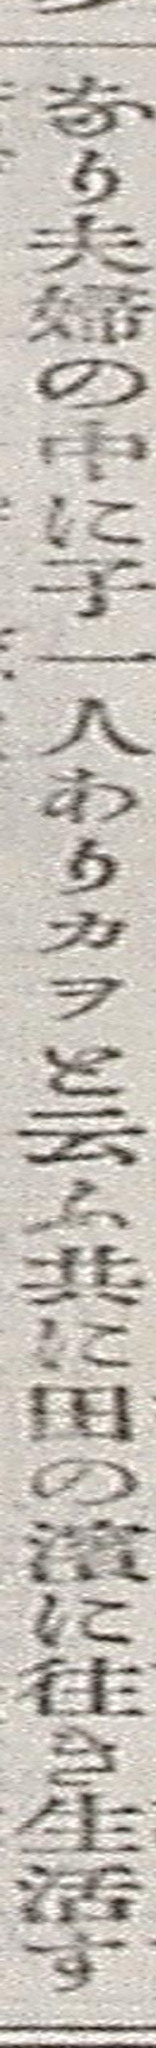なり夫婦の中に子一人ありカヲと云ふ共に田の浜に往き生活す
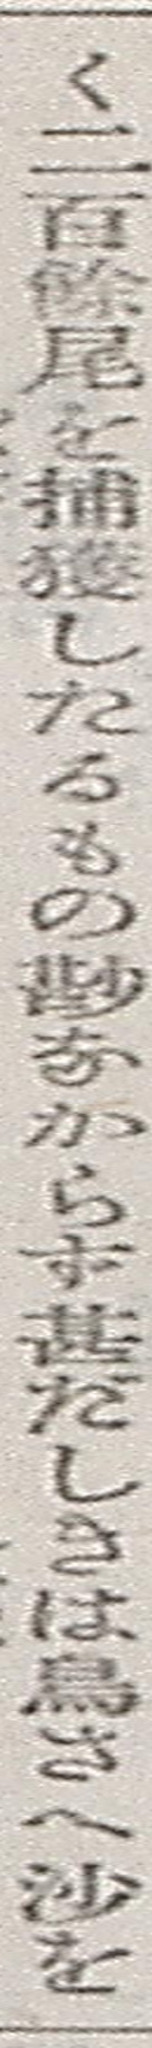くニ百余尾を捕獲したるもの尠なからず甚だしきは鳥さへ沙を
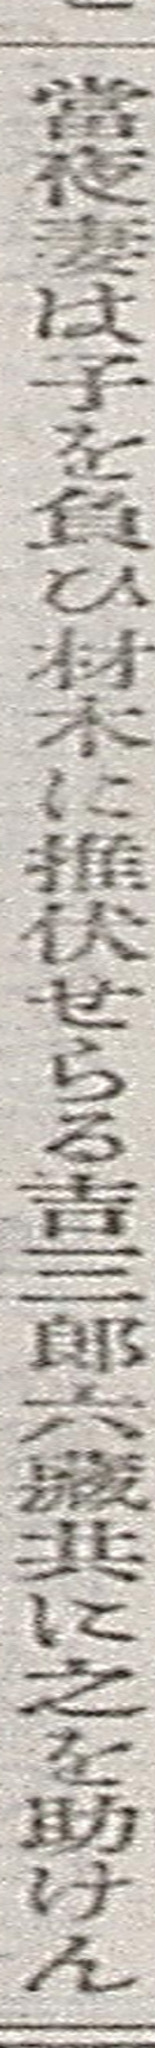当夜妻は子を負ひ材木に推伏せらる吉三郎六蔵共に之を助けん
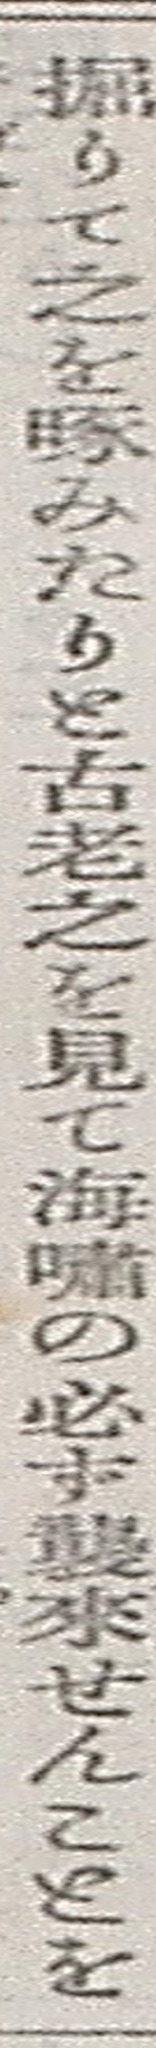掘りて之を啄みたりと古老之を見て海嘯の必ず襲来せんことを
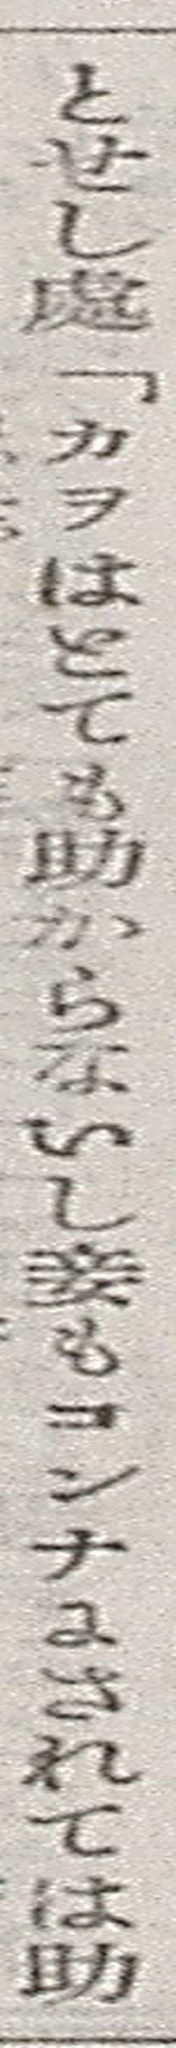とせし処「カヲはとても助からないし妾もコンナにされては助
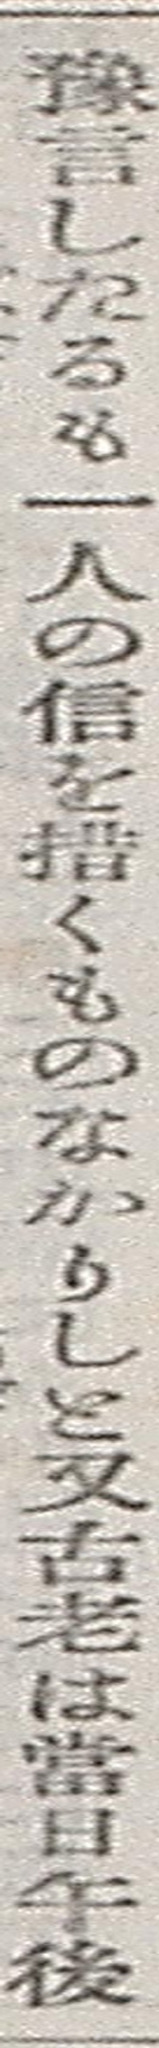予言したるも一人の信を措くものなかりしと又古老は当日午後
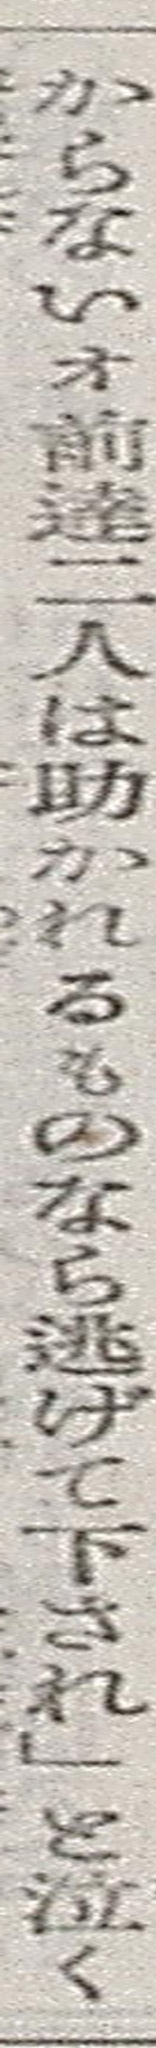からないオ前達二人は助かれるものなら逃げて下され」と泣く
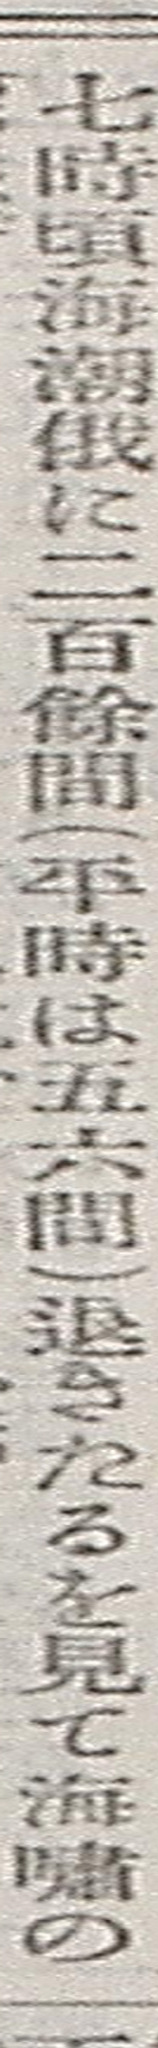七時頃海潮俄かにニ百余間退きたるを見て海嘯の
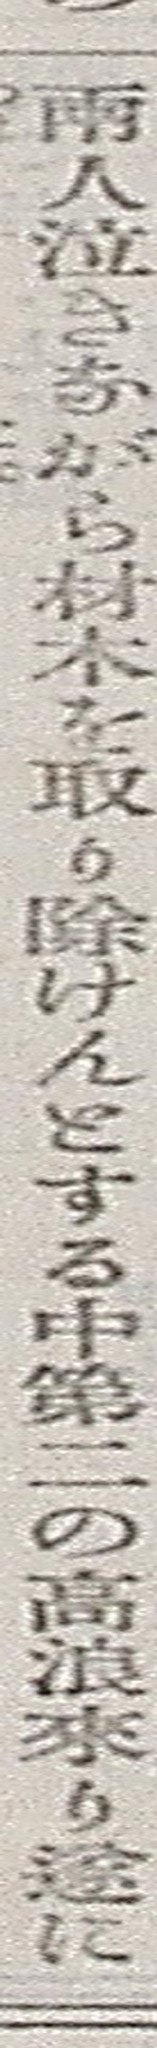両人泣きながら材木を取り除けんとする中第二の高浪来り遂に
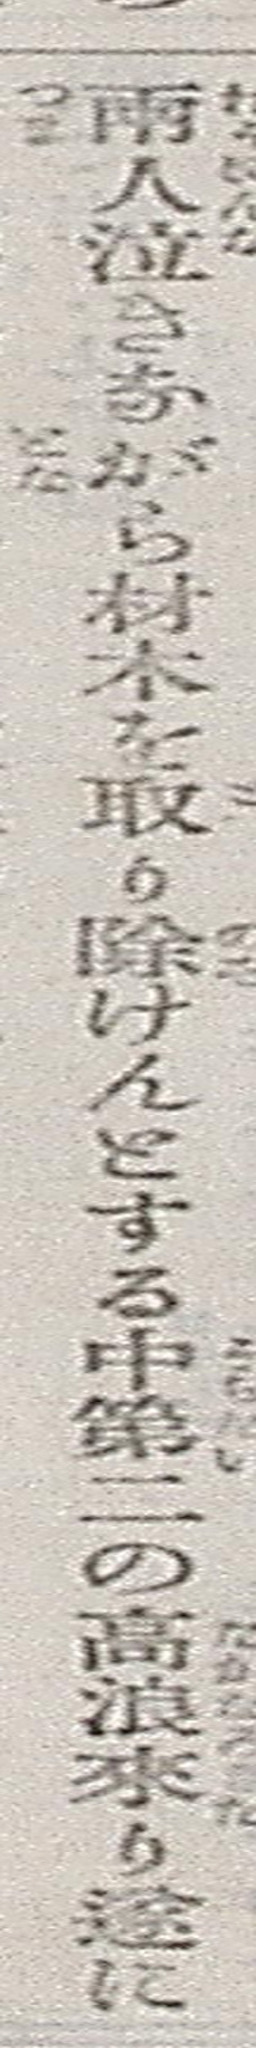両人泣きながら材木を取り除けんとする中第二の高浪来り遂に
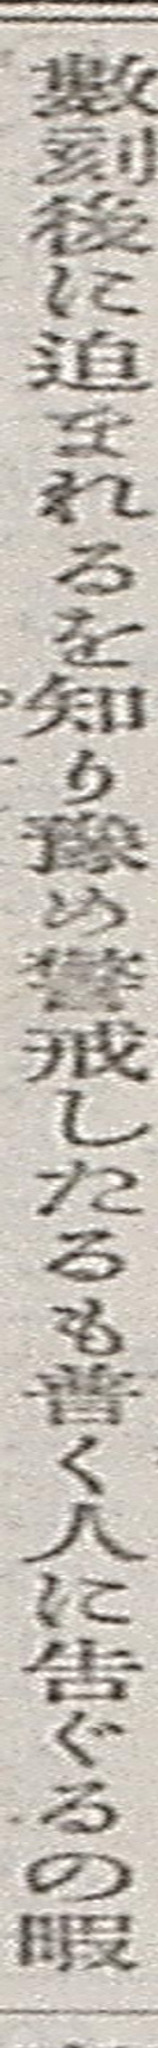数刻後に迫まれるを知り予め警戒したるも普く人に告ぐるの暇
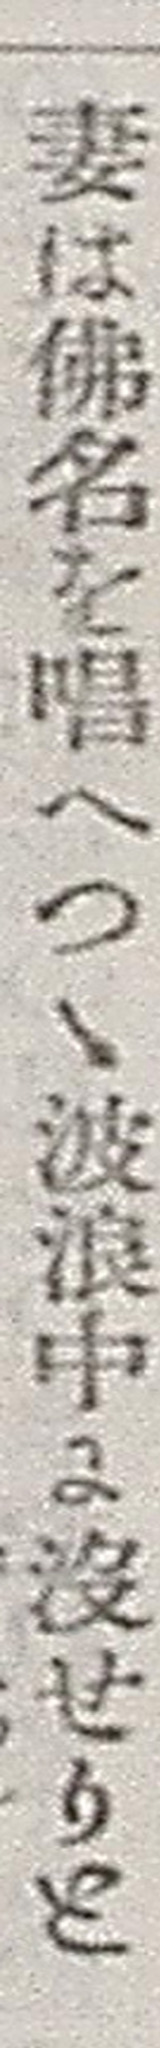妻は佛名を唱へつゝ波浪中に没せりと
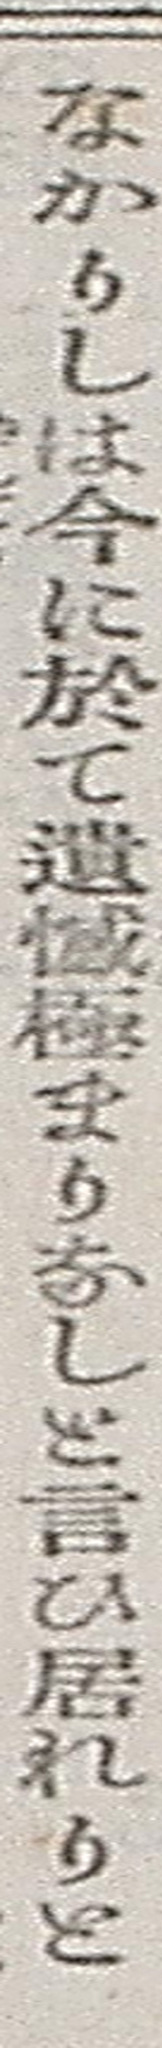なかりしは今に於て遺憾極まりなしと言ひ居れりと
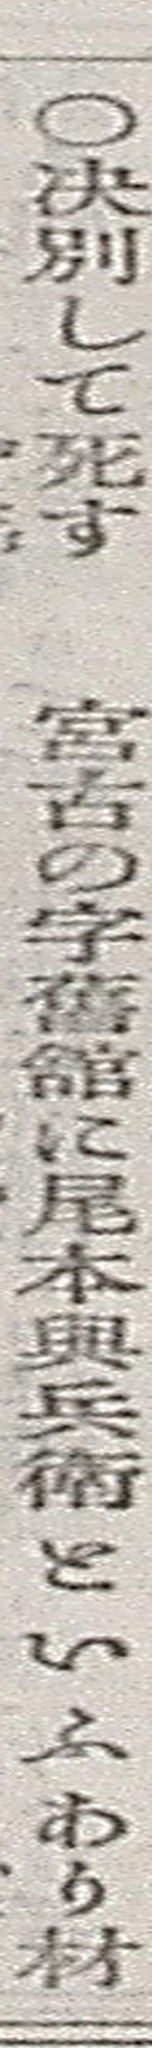○決別して死す宮古の字旧舘に尾本與兵衛といふあり材
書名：風俗畫報臨時増刊第百二十號　大海嘯被害録（下）
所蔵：東京大学地震研究所図書室 Earthquake Research Institute Library, The University of Tokyo, JAPAN
